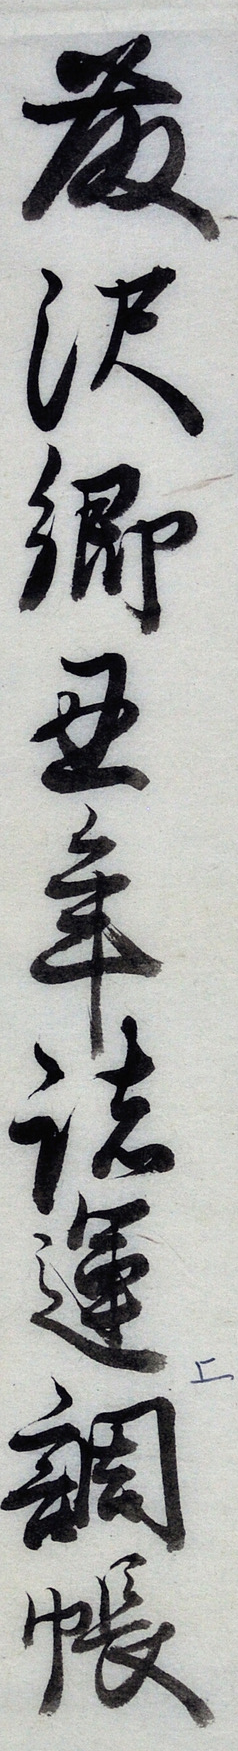藤沢郷丑年諸運上調帳
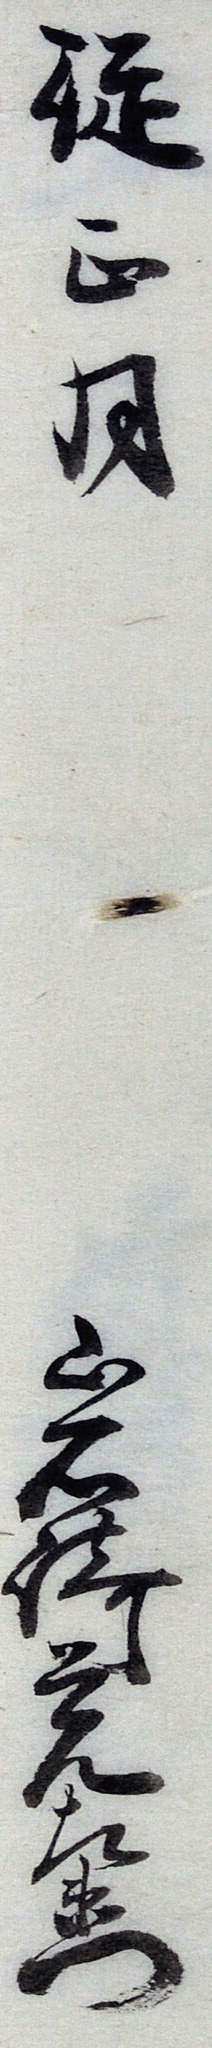従正月岩崎覚左衛門
